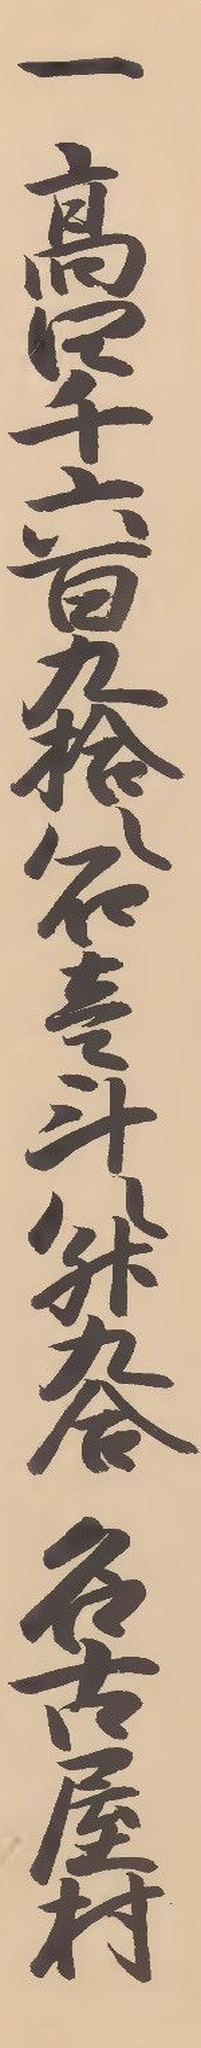一高四千六百九拾八石壱斗八升九合名古屋村
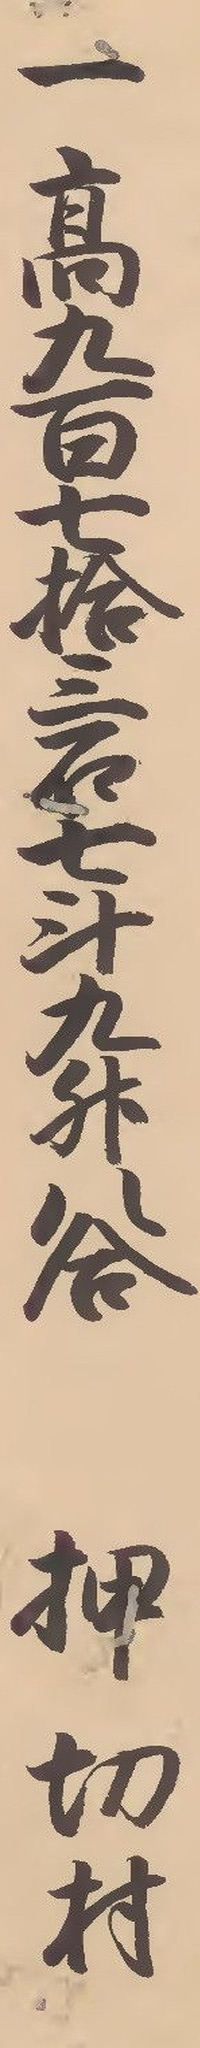一高九百七拾三石七斗九升八合押切村

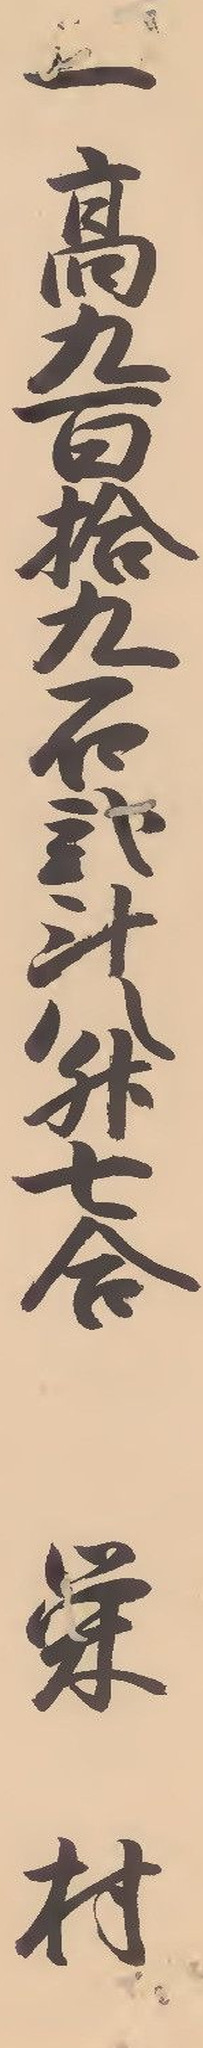一高九百拾九石弐斗八升七合栄村
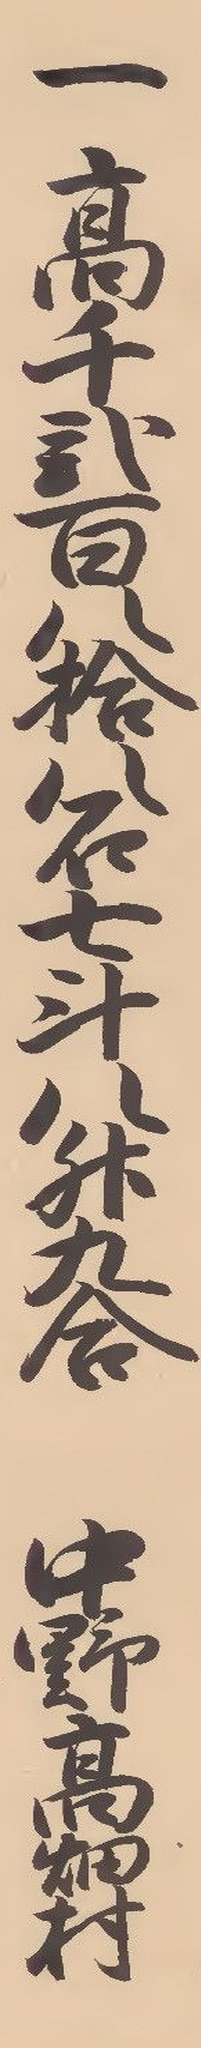一高千弐百八拾八石七斗八升九合中野高畑村
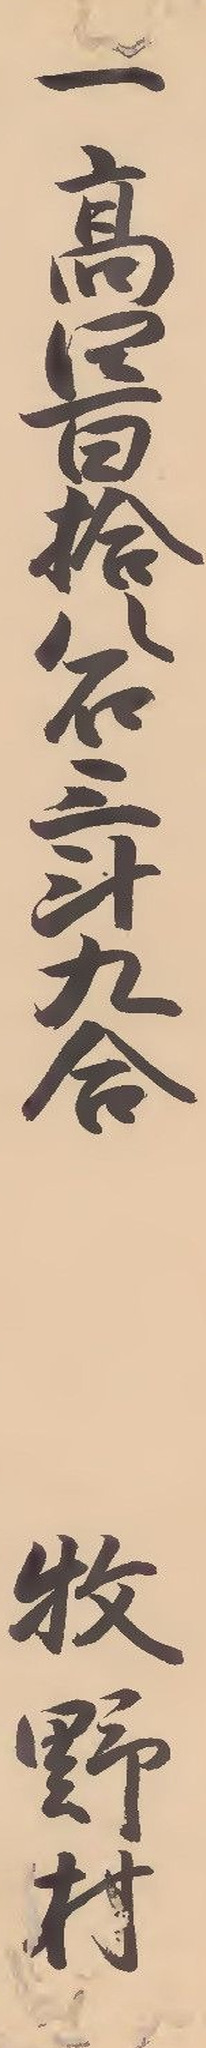一高四百拾八石三斗九合牧野村
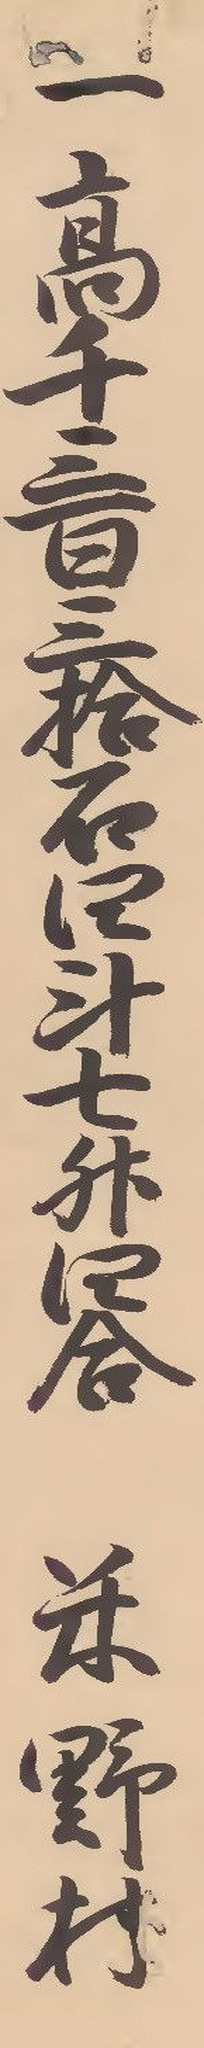一高千三百三拾石四斗七升四合米野村
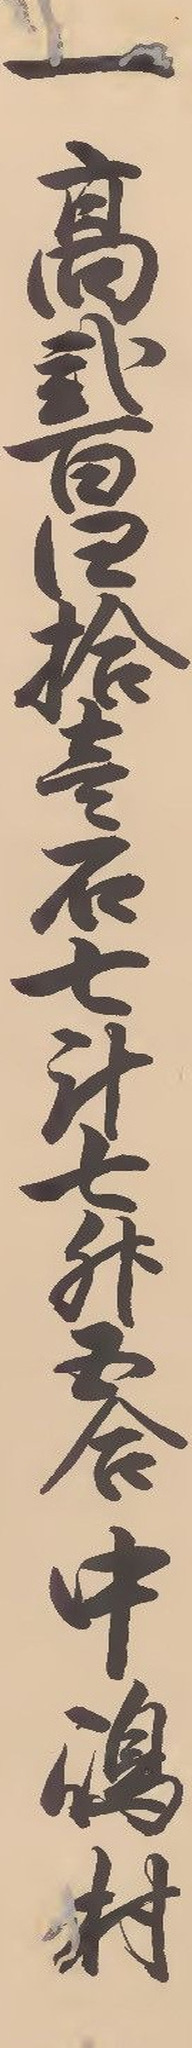一高弐百四拾壱石七斗七升五合中島村
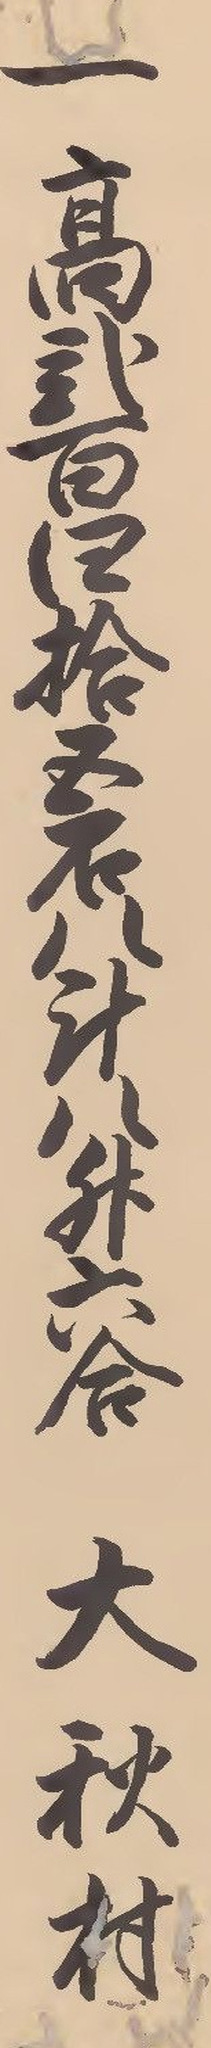一高弐百四拾五石八斗八升六合大秋村
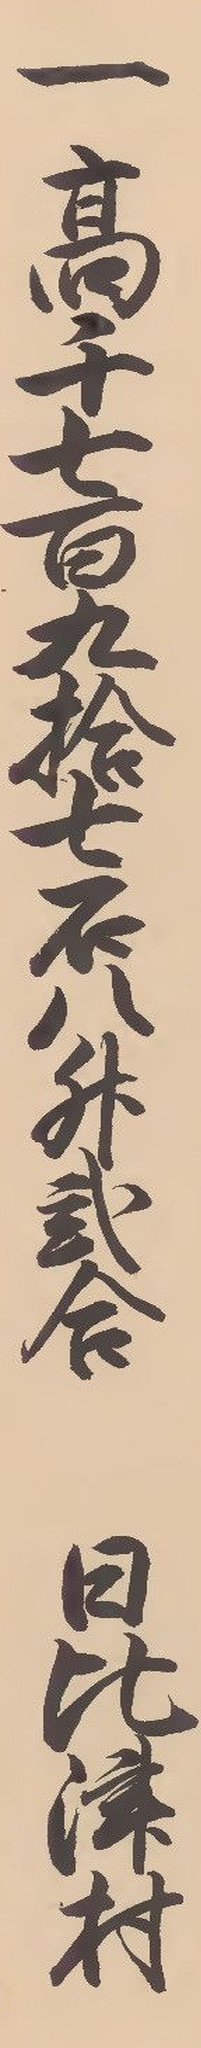一高千七百九拾七石八升弐合日比津村
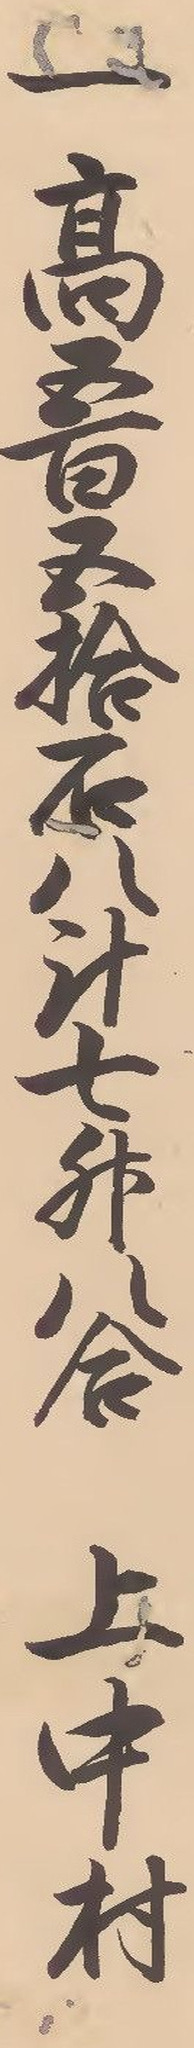一高五百五拾石八斗七升八合上中村

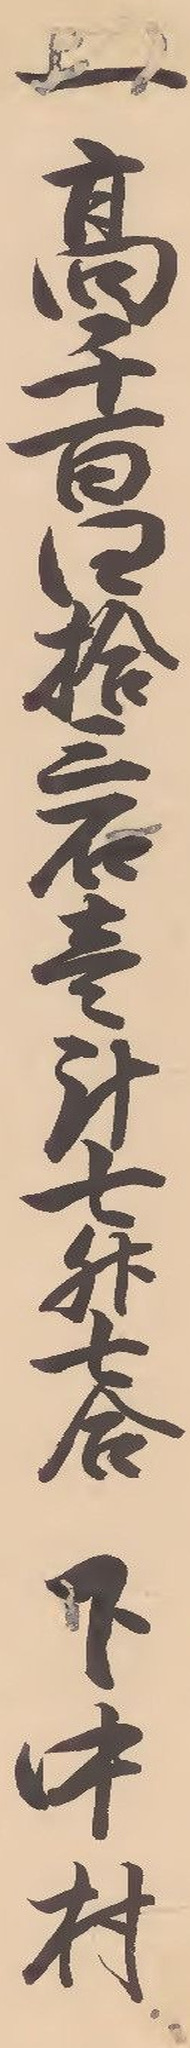一高千百四拾三石壱斗七升七合下中村
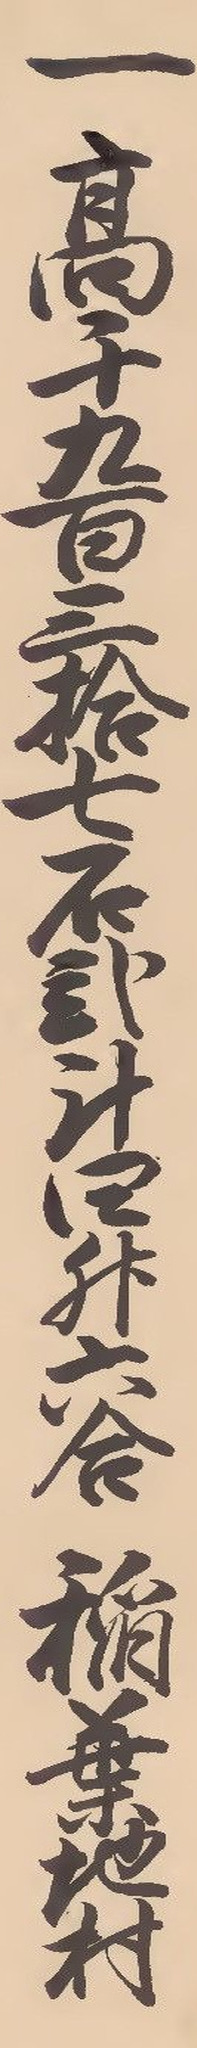一高千九百三拾七石弐斗四升六合稲葉地村
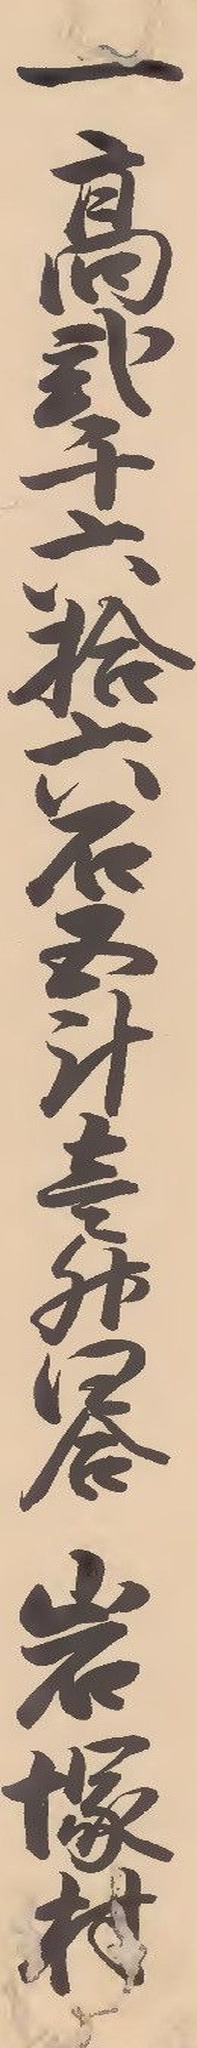一高弐千六拾六石五斗壱升四合岩塚村
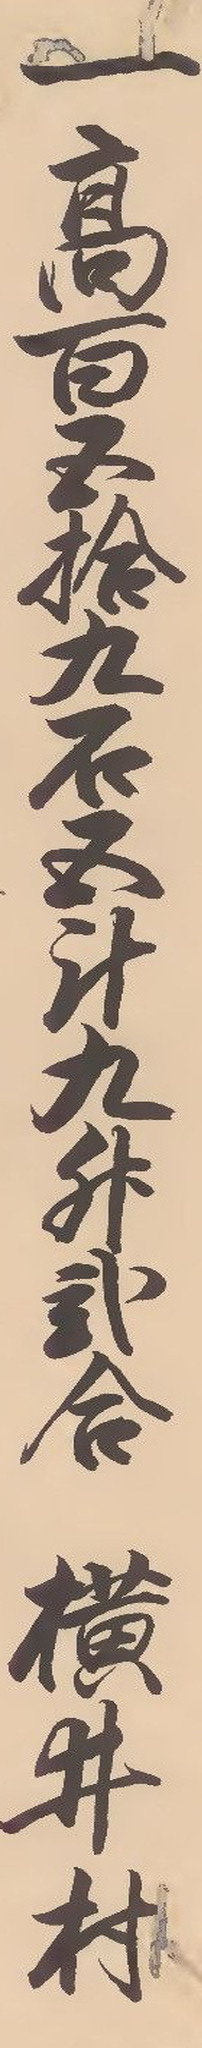一高百五拾九石五斗九升弐合横井村
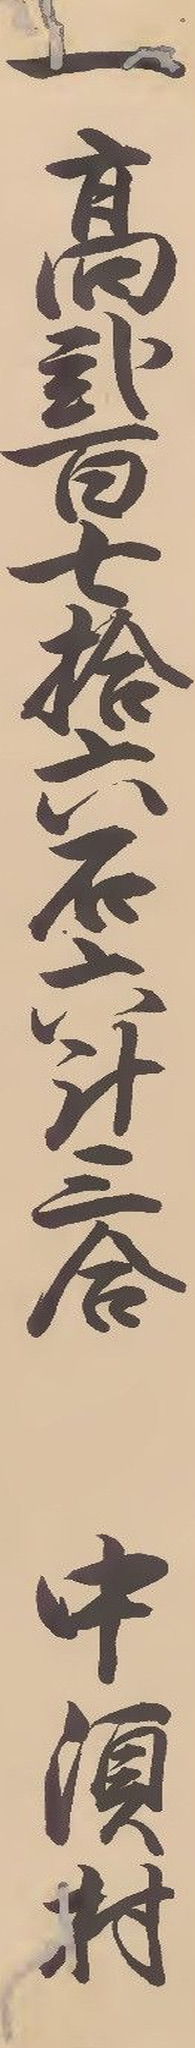一高弐百七拾六石六斗三合中須村
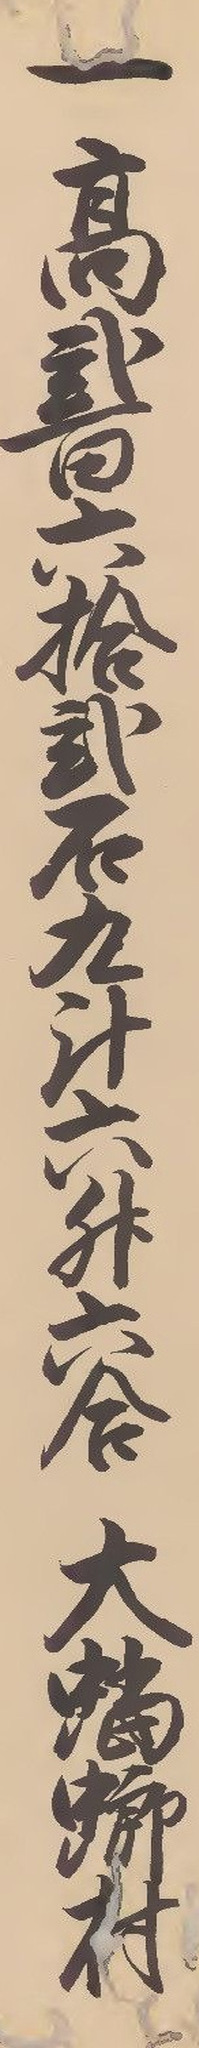一高弐百六拾弐石九斗六升六合大蟷螂村
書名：尾張国郷帳
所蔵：国立公文書館 National Archives of Japan
